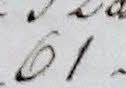61
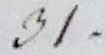31
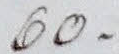60
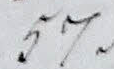57
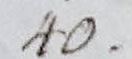40
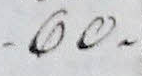60
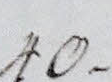40
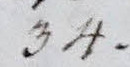34
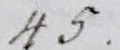45
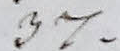37
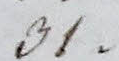31
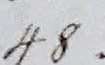48
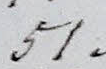51
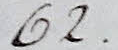62
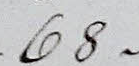68
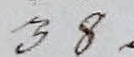38
